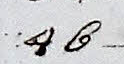46
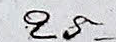25
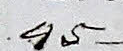45
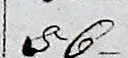56
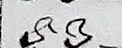53
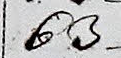63
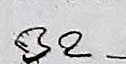32
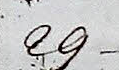29
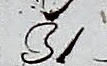31
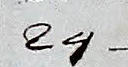24
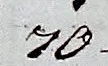70
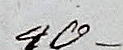40
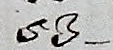53
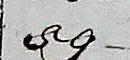59
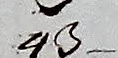43
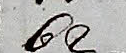62
